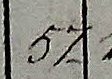57.
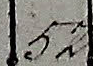52
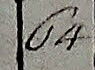64
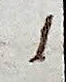1
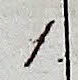1.
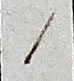1
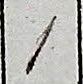1
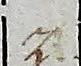2
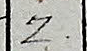2
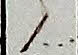1.
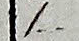1.
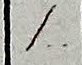1.
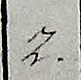2.
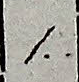1.
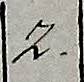2.
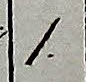1.
